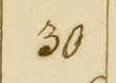30
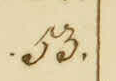53.
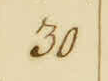30
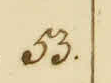53.
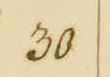30
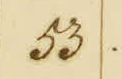53
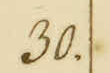30.
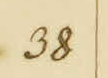38
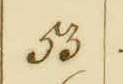53
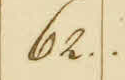62.
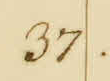37
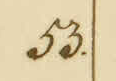53.
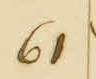61
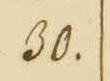30.
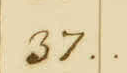37.
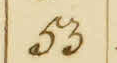53
